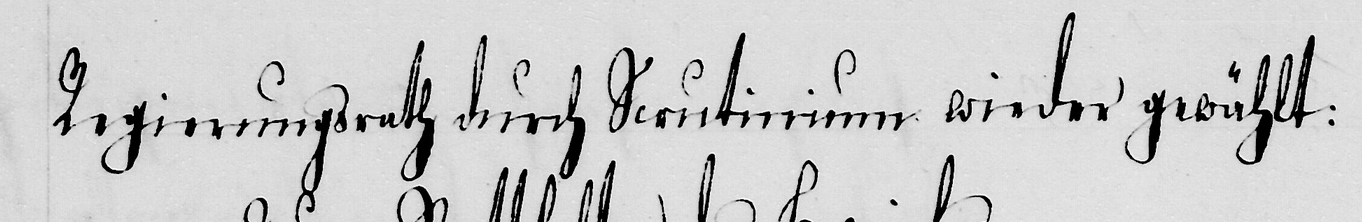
Regierungsrath durch Scrutinium wieder gewählt:
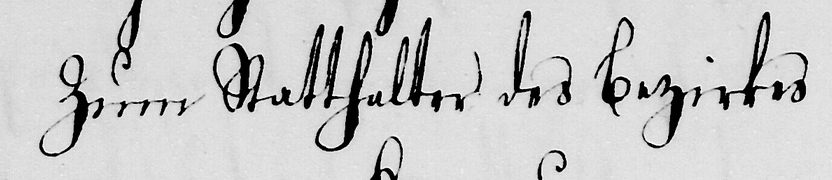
Zum Statthalter des Bezirkes
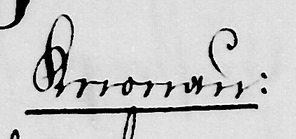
Knonau:
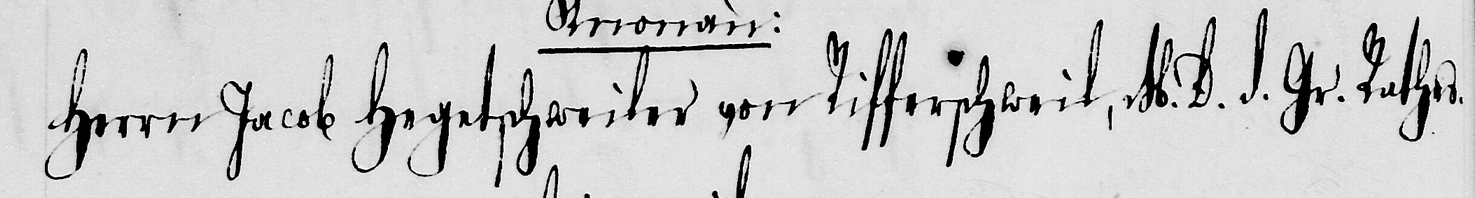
Herrn Jacob Hegetschweiler von Rifferschweil, M. D. d. Gr.
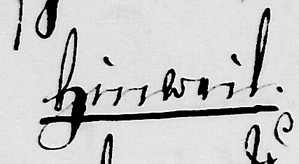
Hinweil:
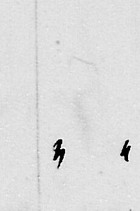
n.
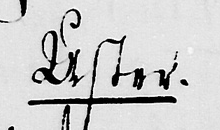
Uster.
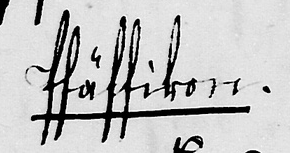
Pfäffiko¬
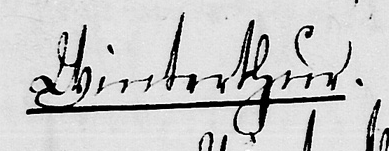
Winterthur.
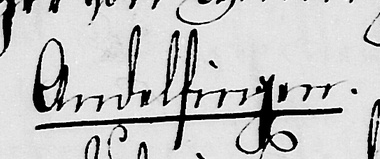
Andelfingen.
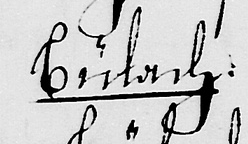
Bülach.
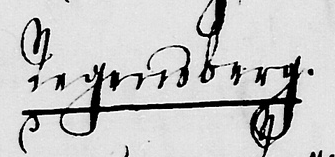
Regensberg.
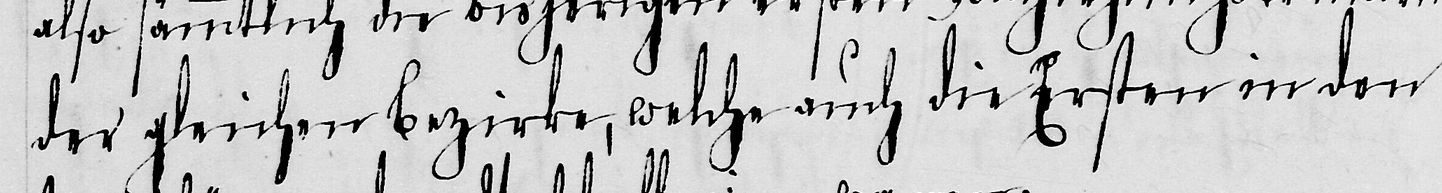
der gleichen Bezirke, welche auch die Ersten in den
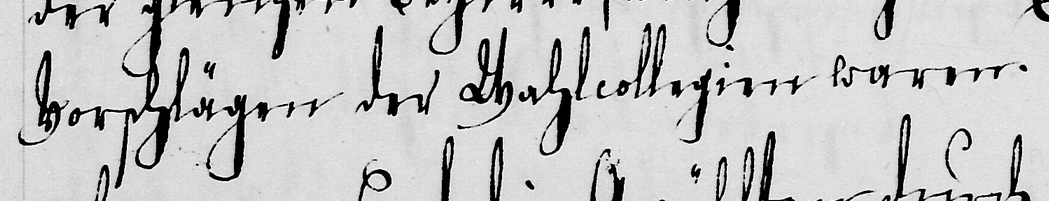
Vorschlägen der Wahlcollegien waren.
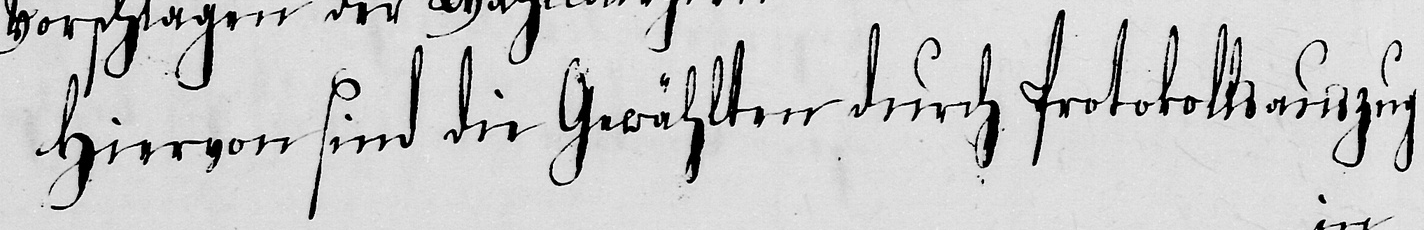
Hiervon sind die Gewählten durch Protocollsauszug
